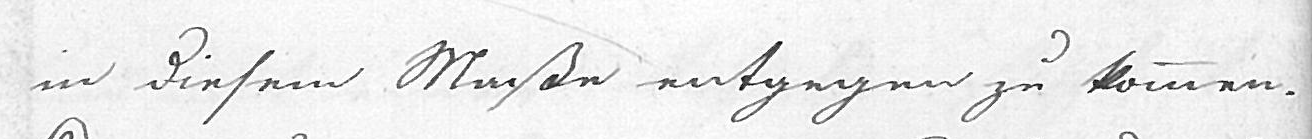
im diesem Maße entgegen zu kommen.
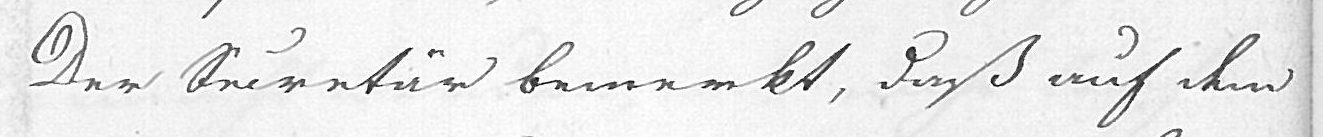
Der Secretär bemerkt, daß auf dem
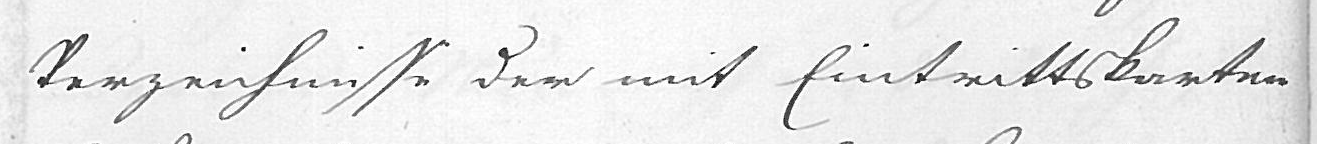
Verzeichnisse der mit Eintrittlkarten
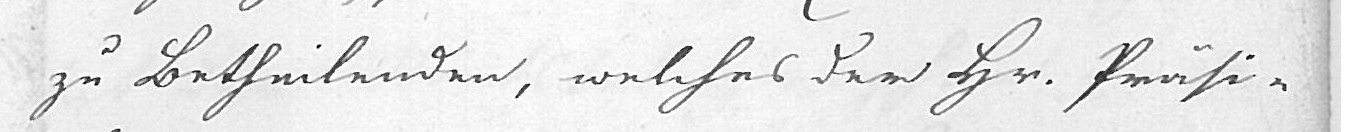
zu Betheilenden, welches der Hr. Präsi-
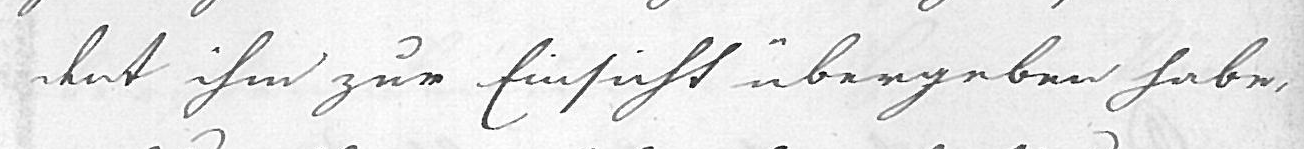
det ihm zur Einsicht übergeben habe,
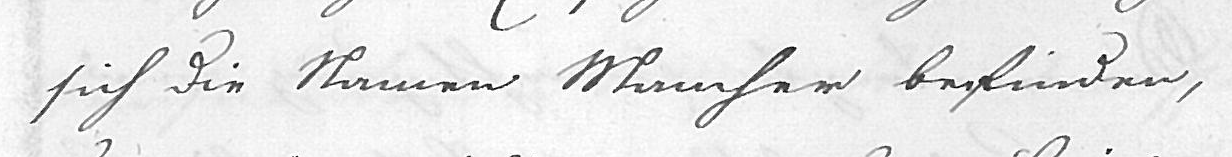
sich die Namen Mancher befinden,
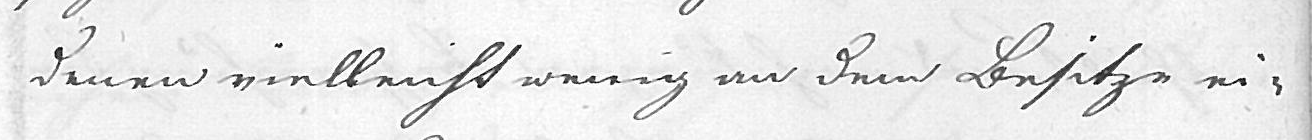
denen vielleicht wenig an dem Besitze ei-
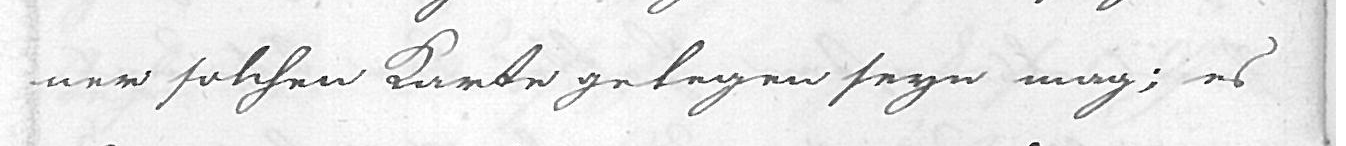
ner solchen Karte gelegen seyn mag; es
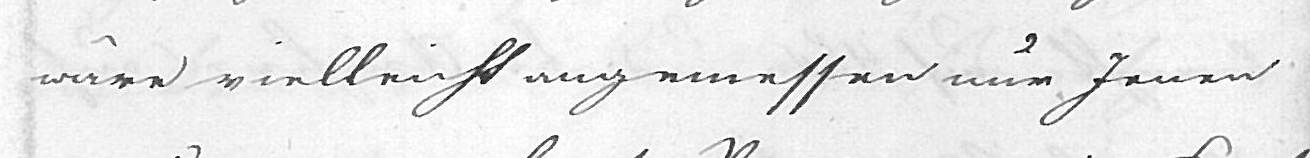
wäre vielleicht angemessen nur jenen
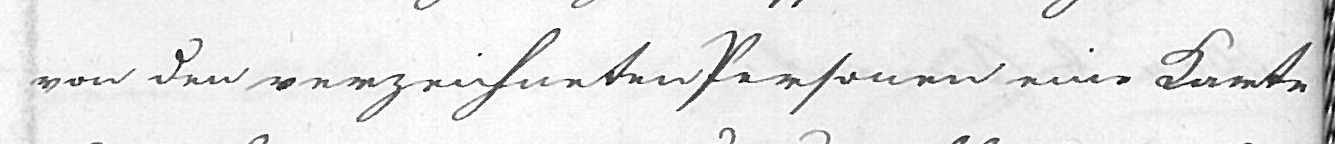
von den verzeichneten Personen eine Karte
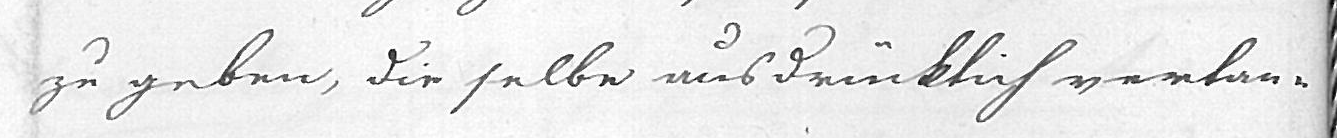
zu geben, dieselbe ausdrücklich verlan-
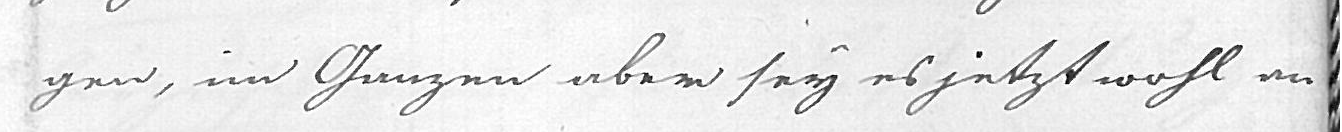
gen, im Ganzen aber sey es jetzt wohl an
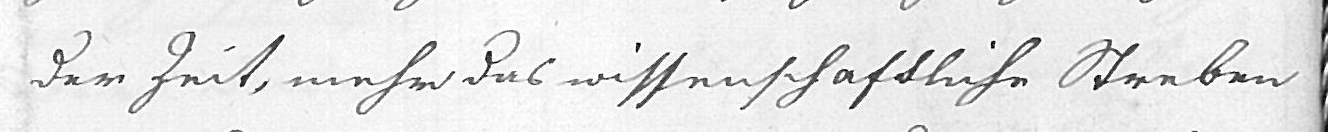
der Zeit, mehr das wissenschaftliche Streben
